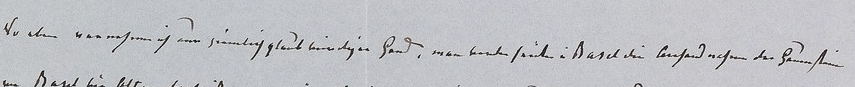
So eben vernehme ich aus ziemlich glaubwürdiger Hand, man werde heute in Basel die Anhandnahme der Hauenstein
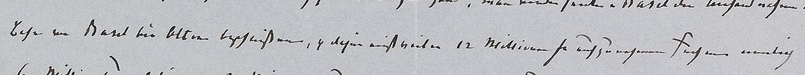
Bahn von Basel bis Olten beschließen, & dafür einstweilen 12 Millionen Fr aufzunehmen suchen nemlich
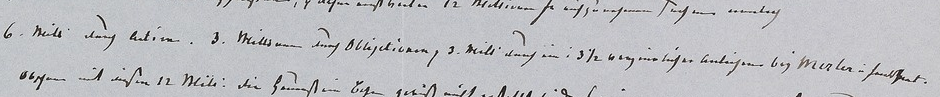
6. Mili durch Actien. 3. Millionen durch Obligationen, 3. Mili durch ein 3 ½ verzinsliches Anleihen bey Mezler in Frankfurt.
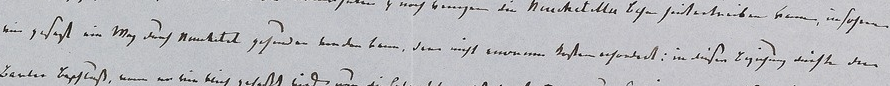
wie gesagt ein Weg durch Neuchatel gefunden werden kann, der nicht enorme Kosten erfordert: in dieser Beziehung dürfte der
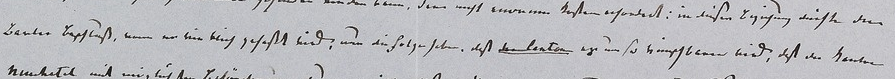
Basler Beschluß, wenn er wirklich gefaßt wird, nun die Folge haben, daß der Canton es um so wünschbarer wird, daß der Kanton
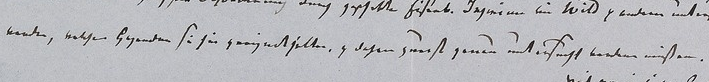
werde, welche Gegenden sie für geeignet halten, & daher zuerst genau untersucht werden müßen.
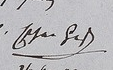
Escher Heß
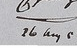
52.
